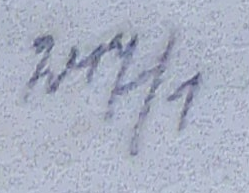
247/1
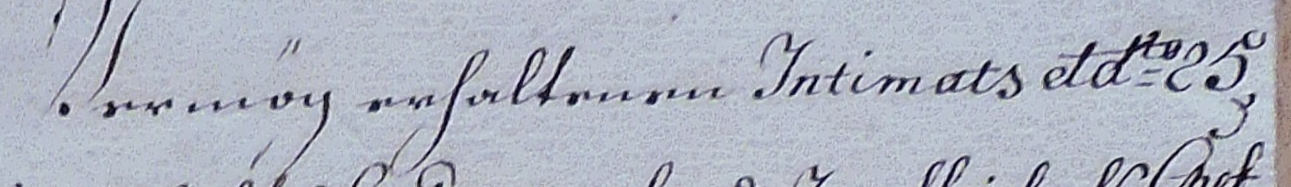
Vermög erhaltenen Intimats et dto̳ 25,
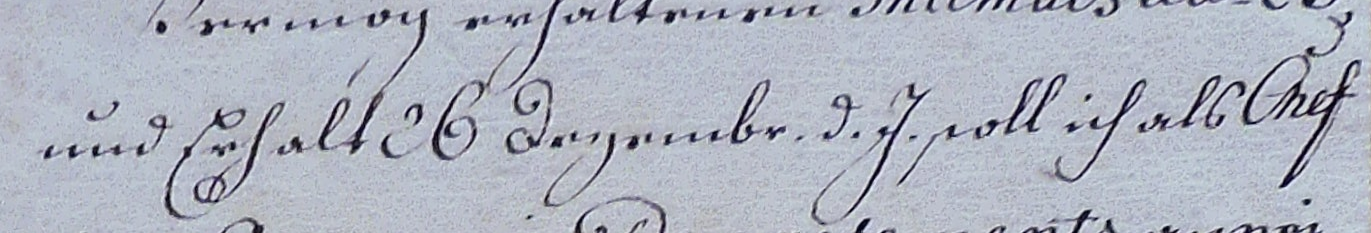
und Erhalt 26 Dezember d.J. soll ich als Chef
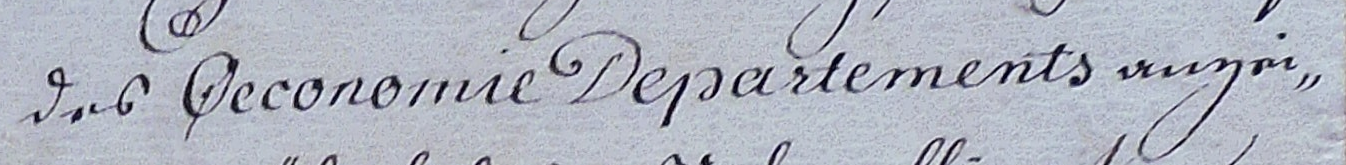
des Oeconomie Departements anzei¬
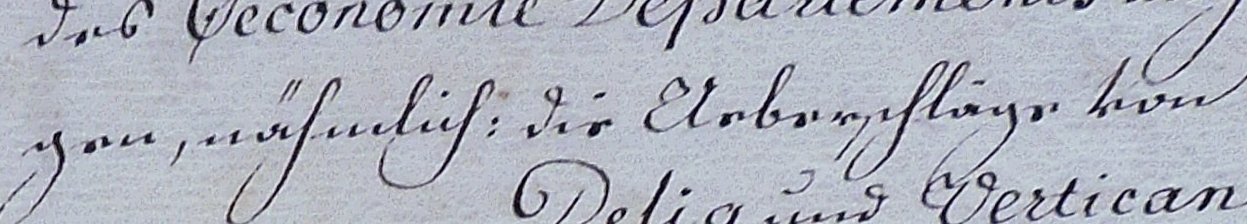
gen, nähmlich die Ueberschläge von
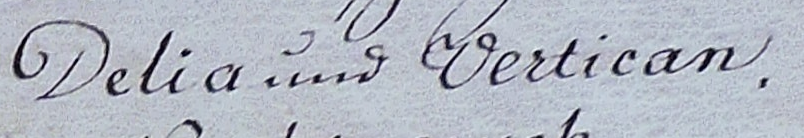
Delia und Vertican.
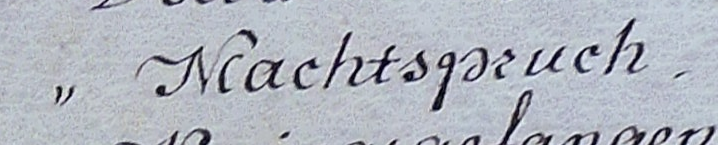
" Nachtspruch.
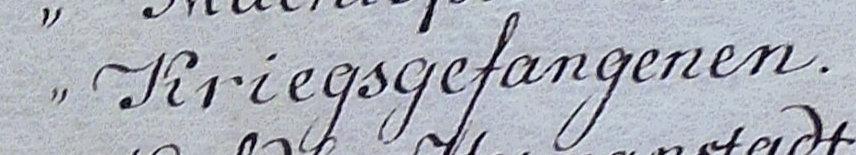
" Kriegsgefangenen.
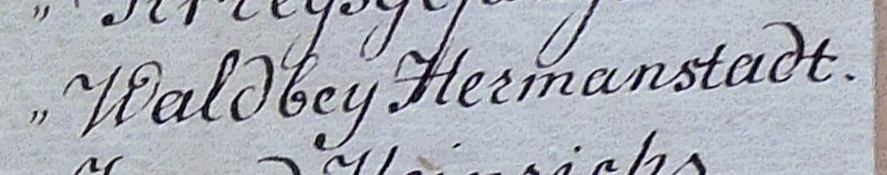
" Wald bey Hermanstadt.
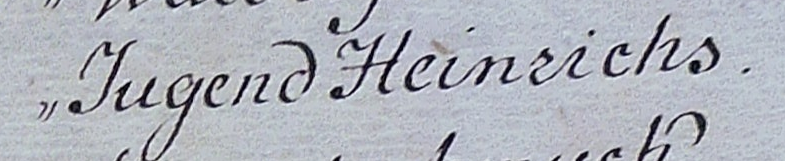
" Jugend Heinrichs.
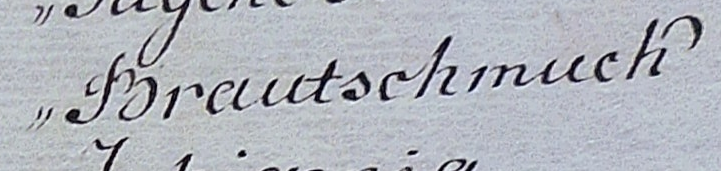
" Brautschmuck
